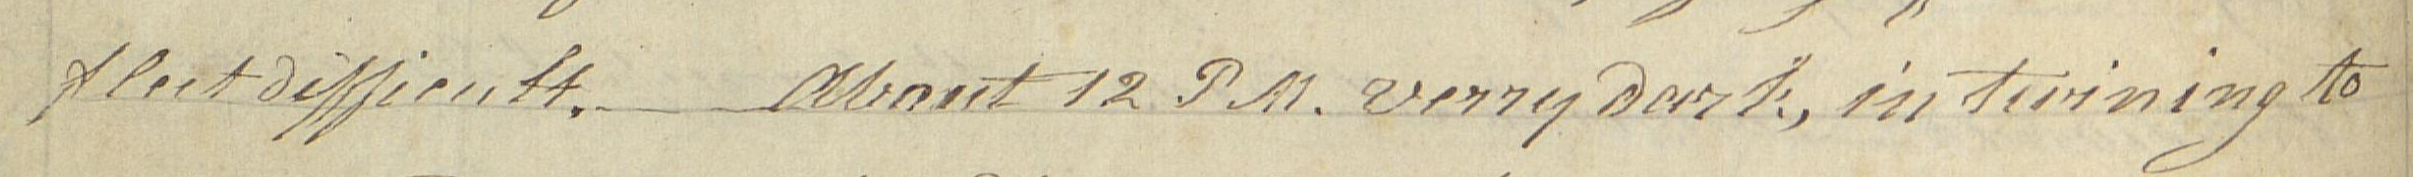fleet difficult. About 12 PM. verry dark, in turning to
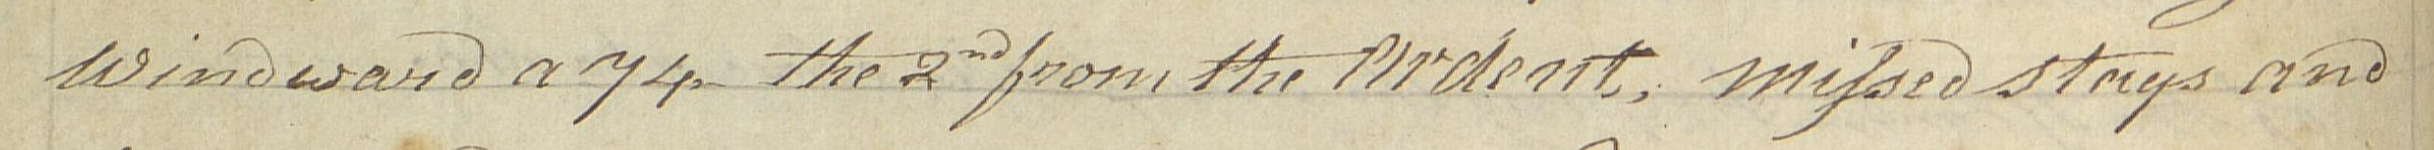Windward a 74. The 2^nd from the Ardent. missed stays and
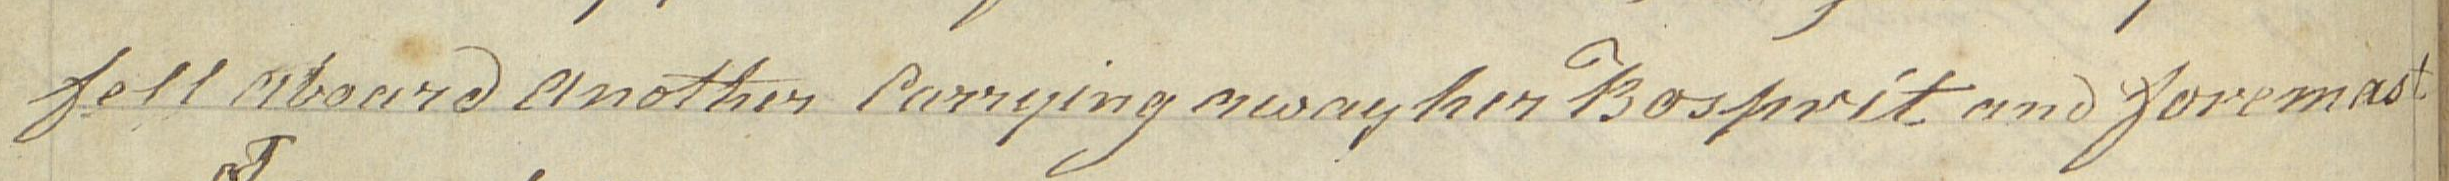fell Aboard Another Currying away his Bosprit and foremast
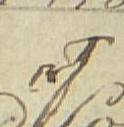of
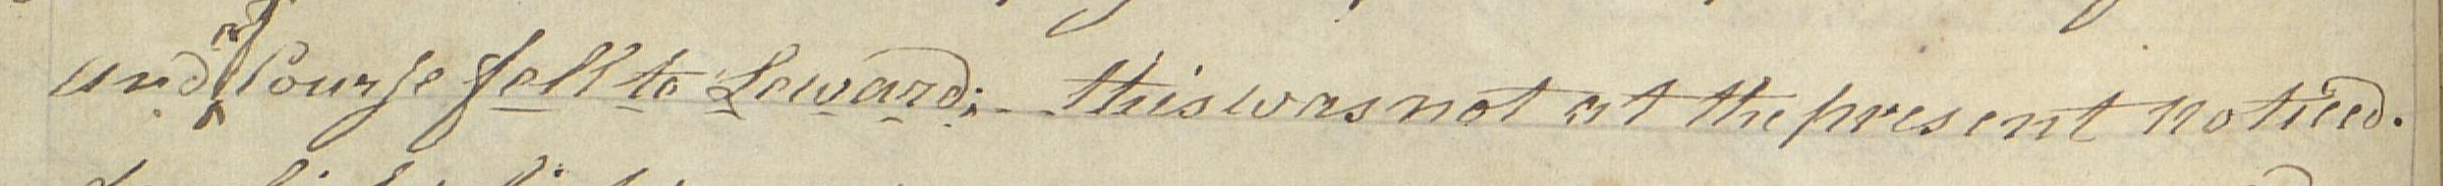and ^ course fell to Leward; this was not at the present noticed.
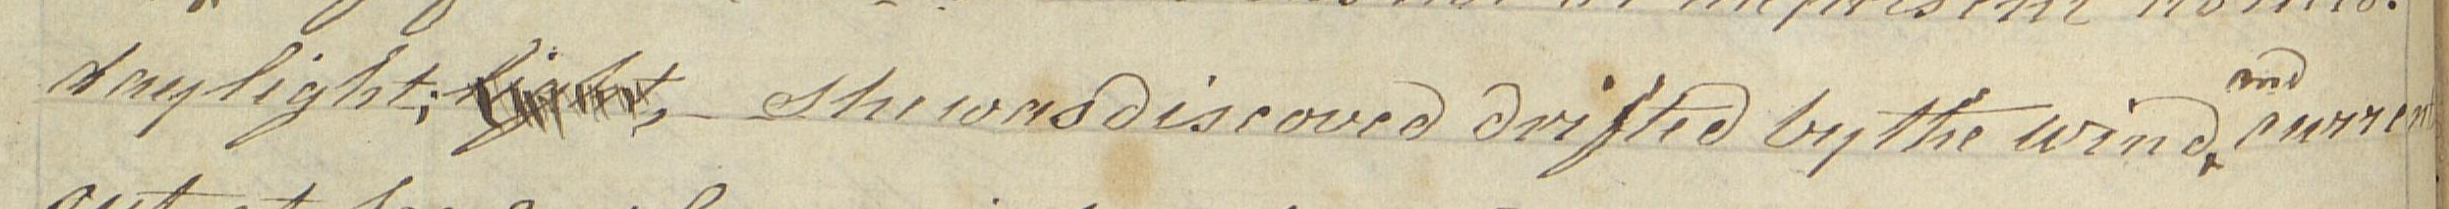day Light; light, she was discoved drifted by the wind ^ current
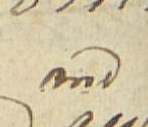and
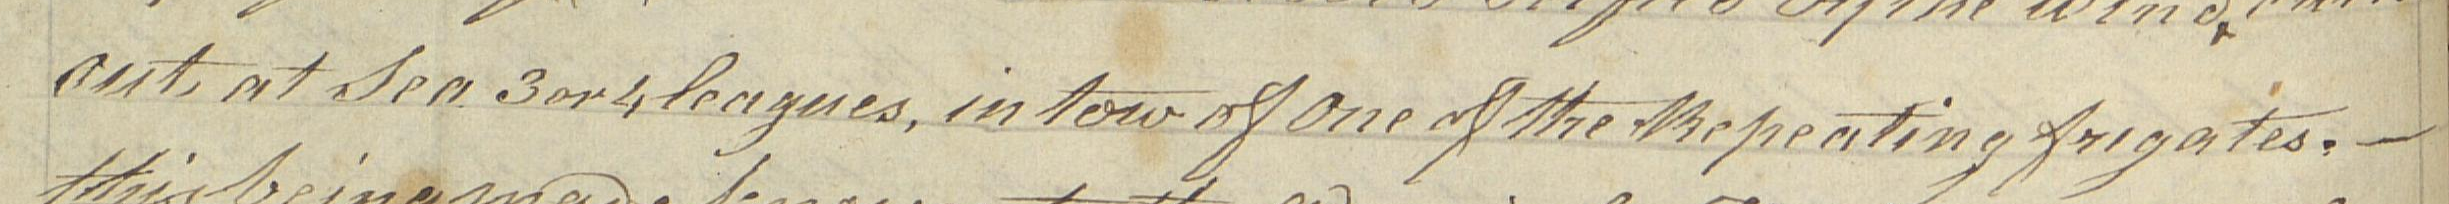out at Sea 3 or 4 leagues, in tow of one of the Repeating frigates.
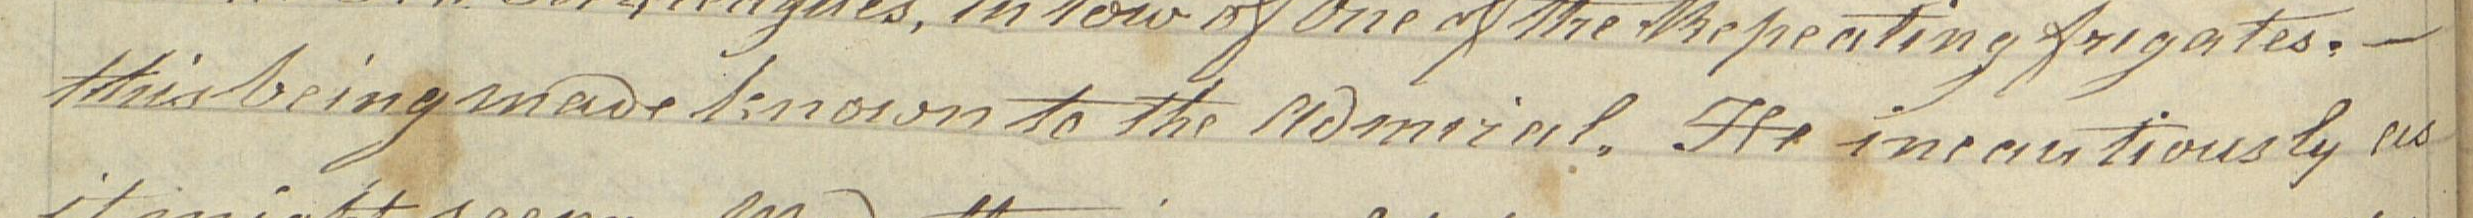this being made known to the Admiral. He incautiously as
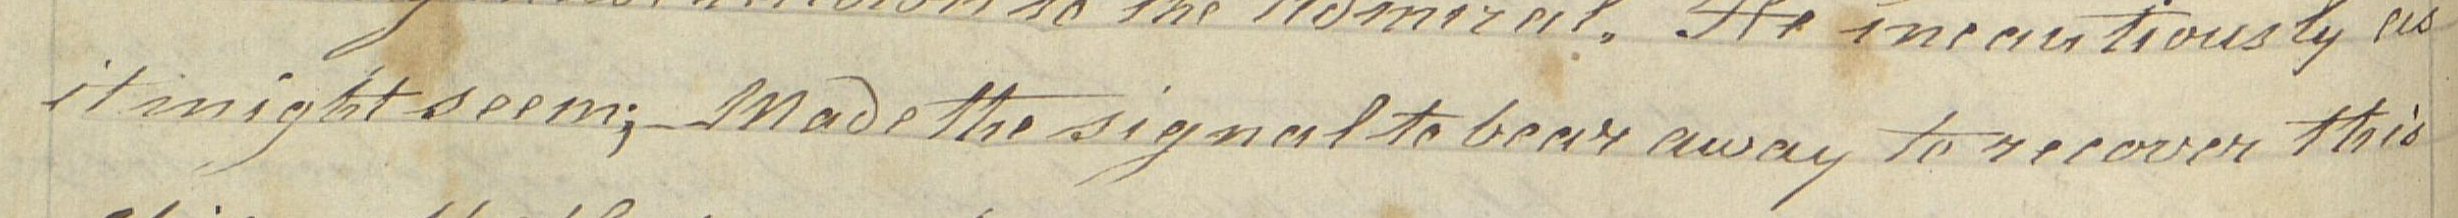it might seem; Made the signal to bear away to recover this
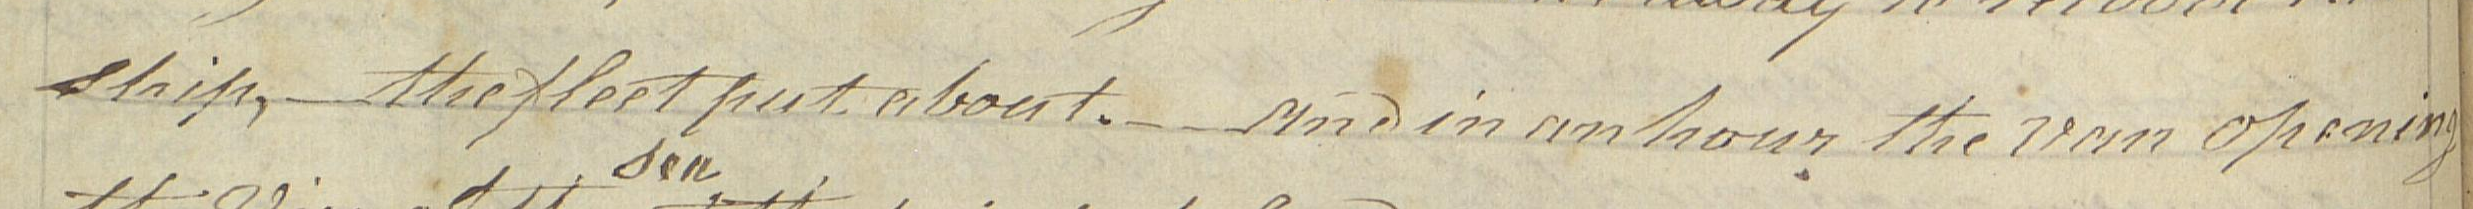Ship, the fleet put about. And in an hour the Van opening
